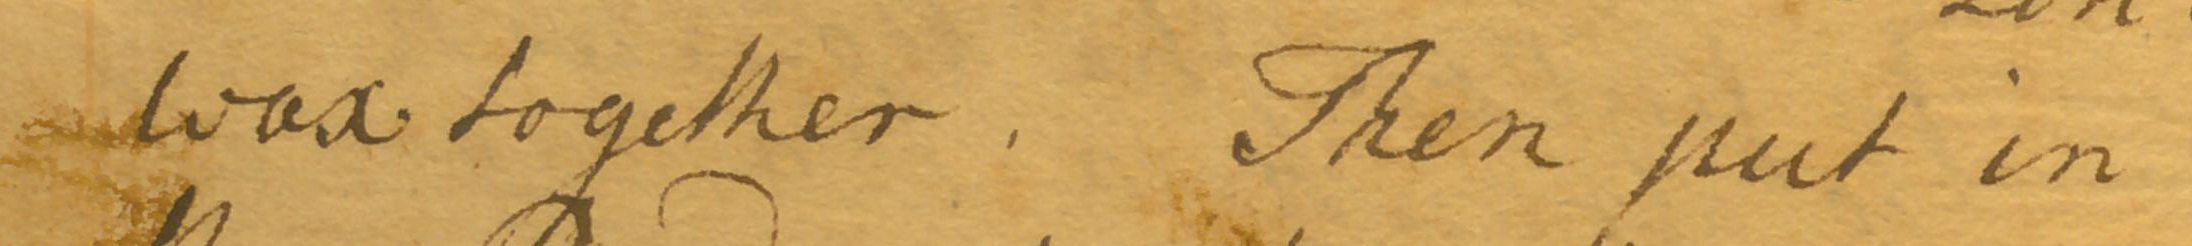wax together. Then put in
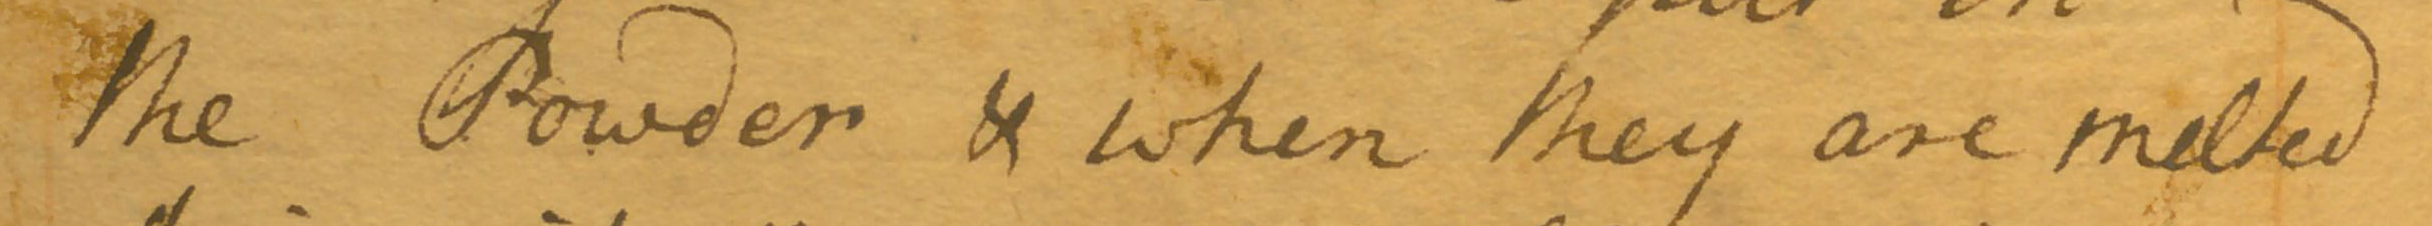the Powder & when they are melted
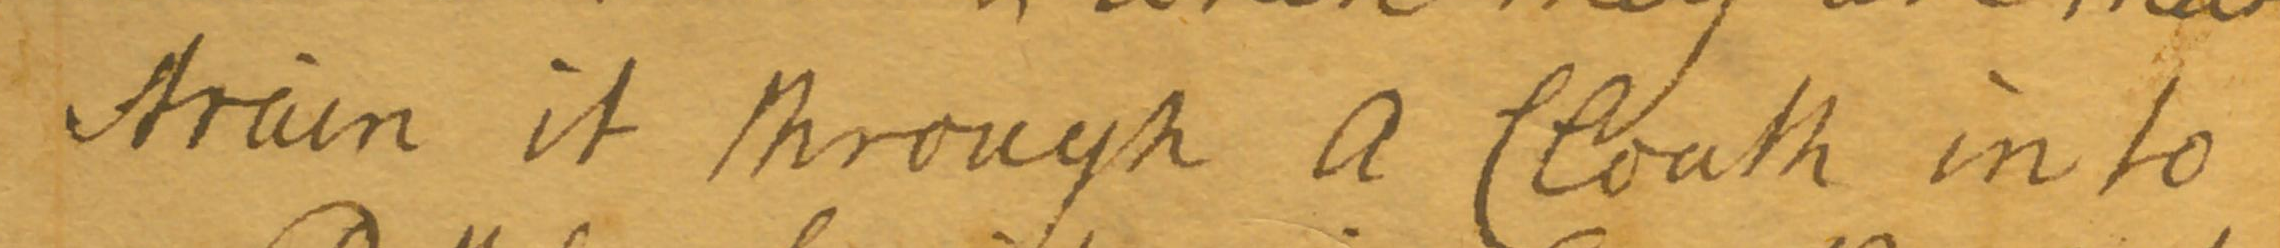strain it through a Cloath in to
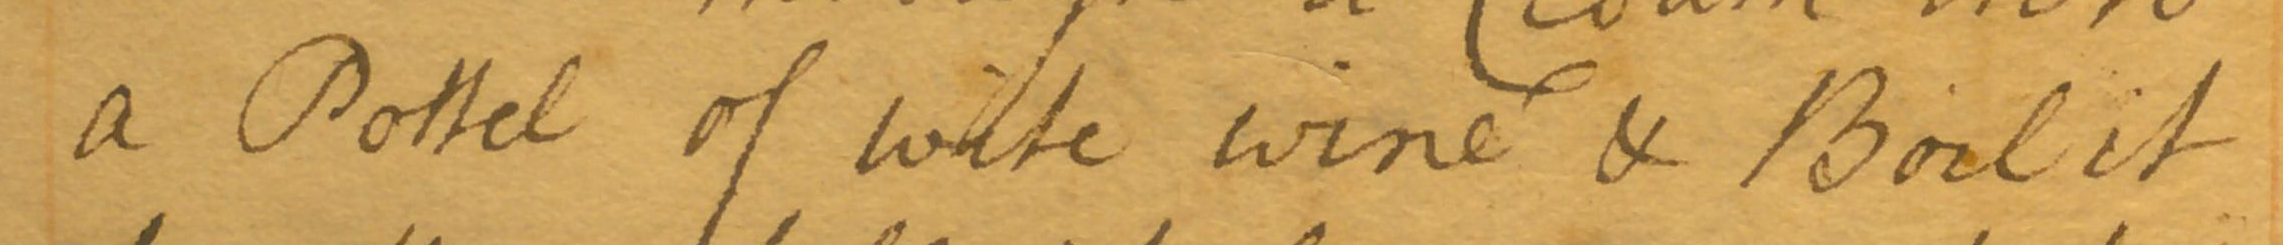a Pottel of wite wine & Boil it
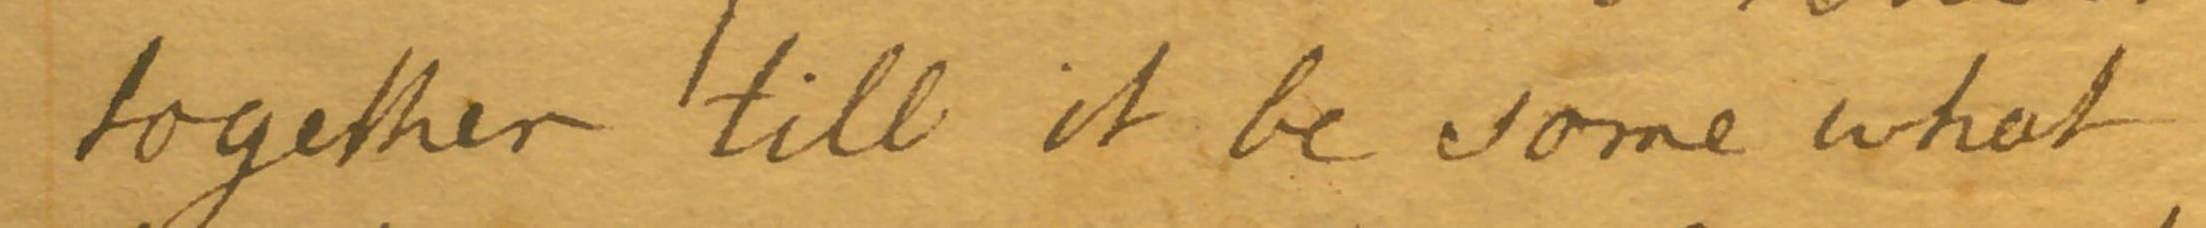together till it be some what
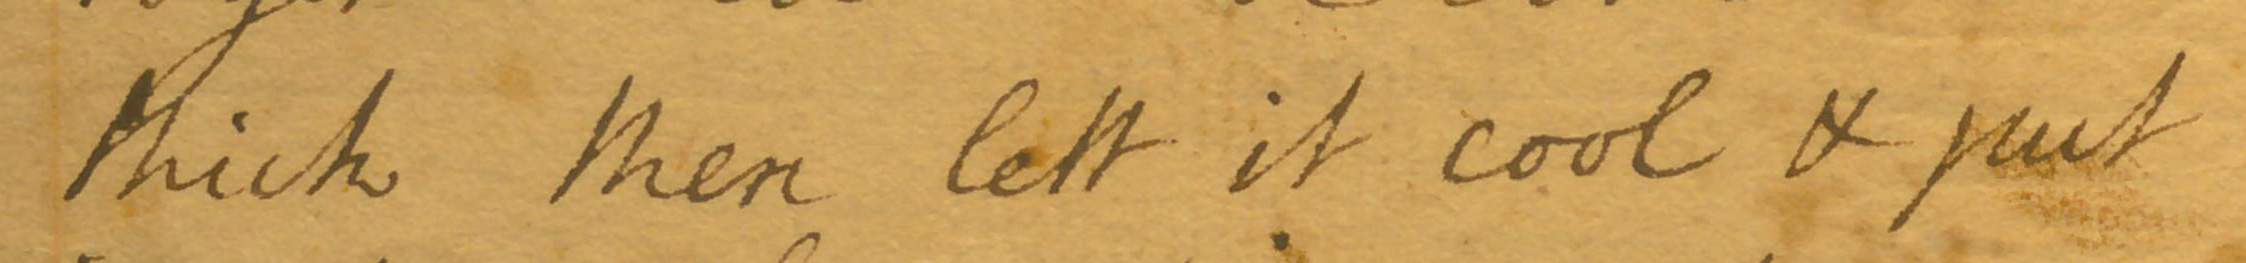thick then lett it cool & put
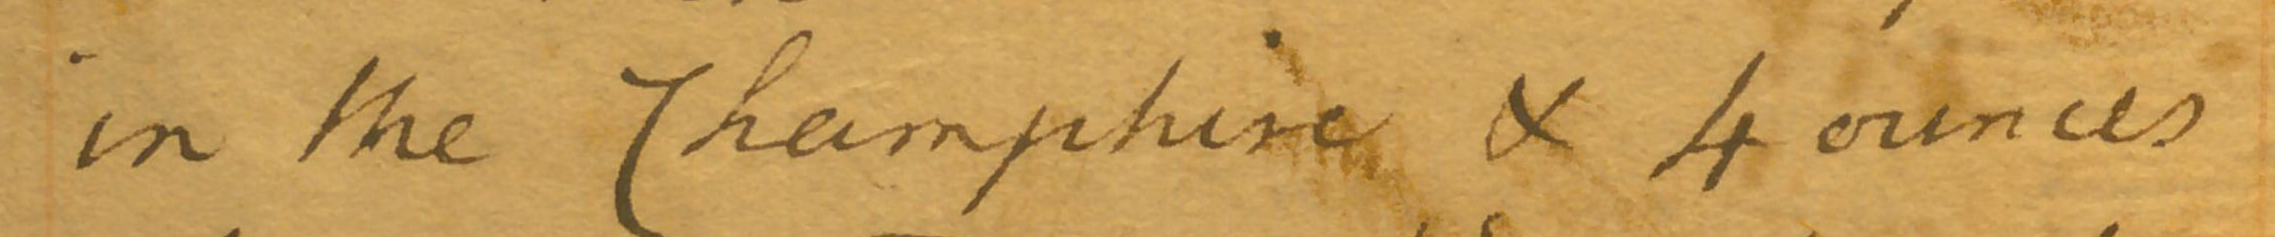in the Champhire & 4 ounces
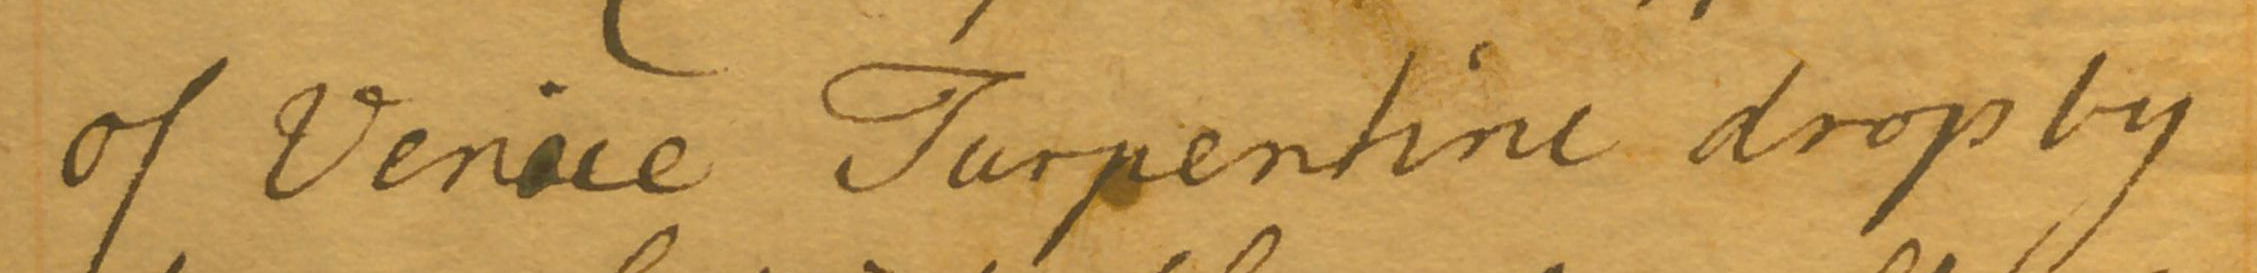of Venice Turpentine drop by
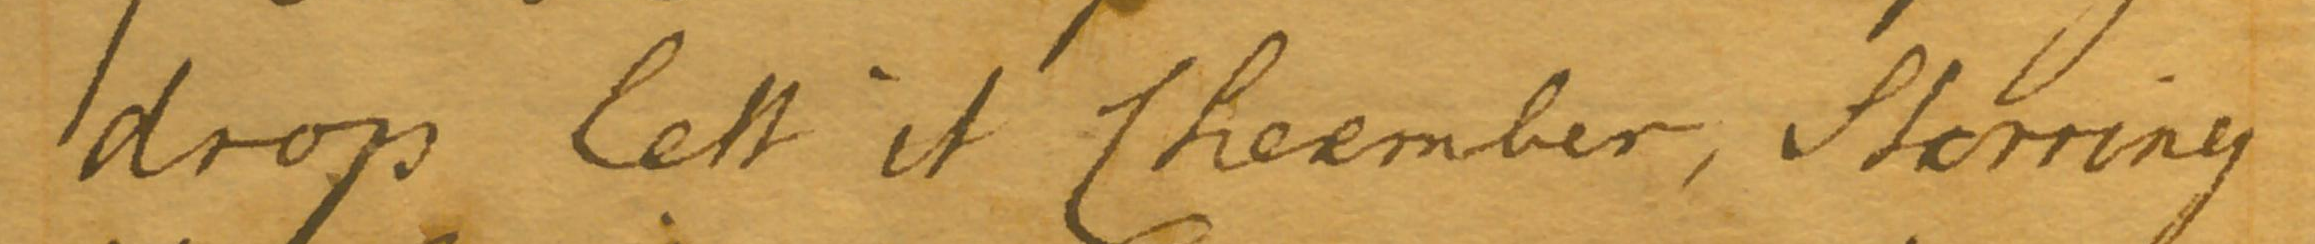drop lett it Cheember, sterring
